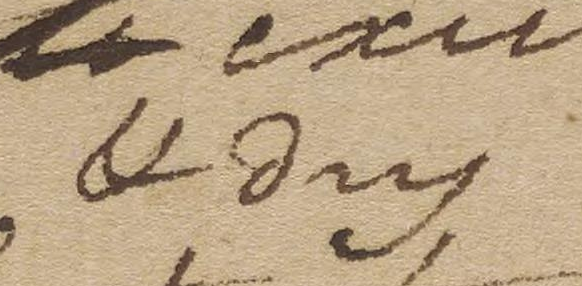& dry
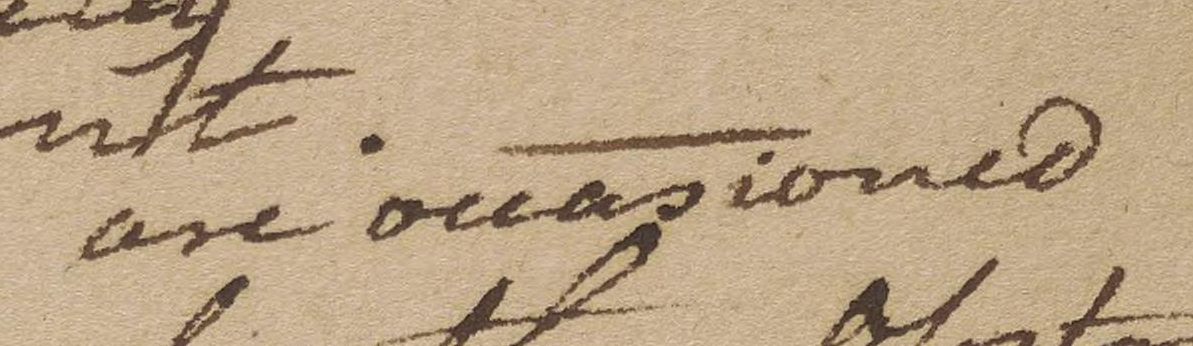are occasioned
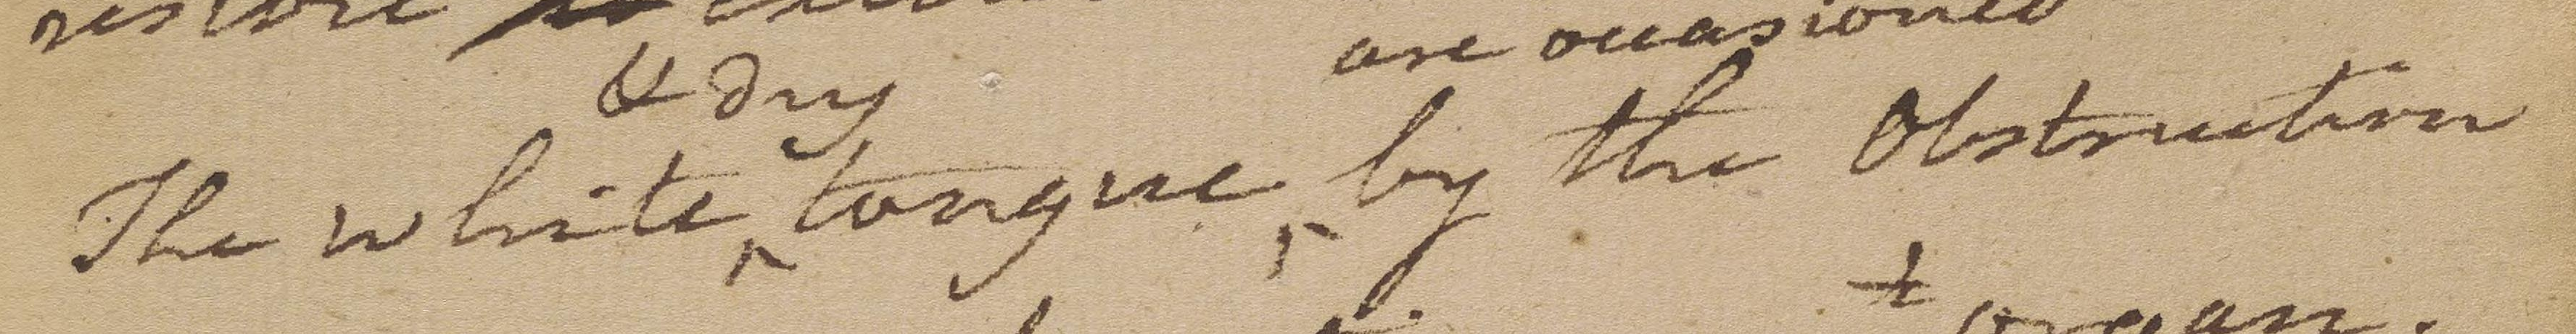The white ^ tongue ^ by the obstruction
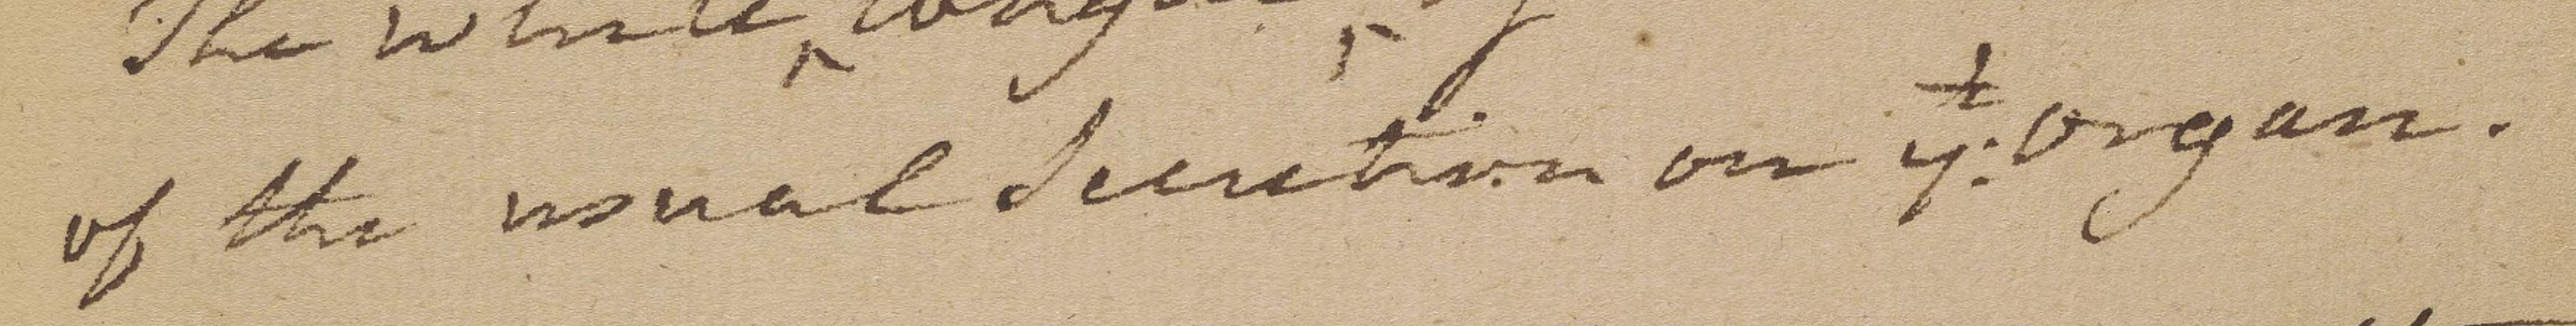of the usual secretion our y^t: organ.
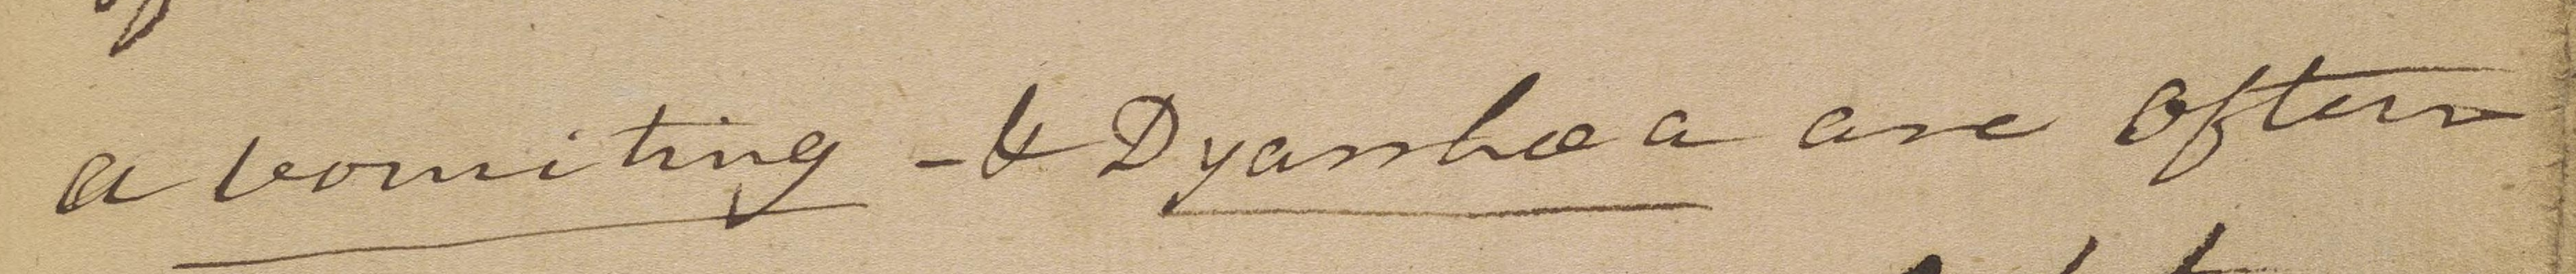a vomiting- & dyarrhea are often
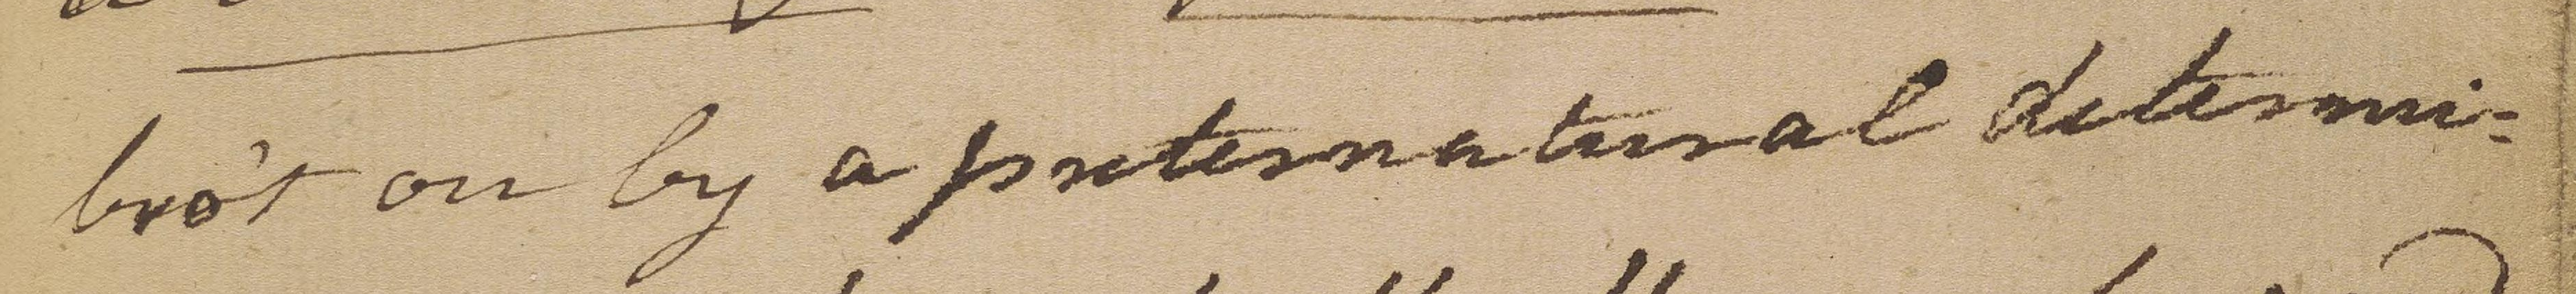bro't on by a preternatural determi-
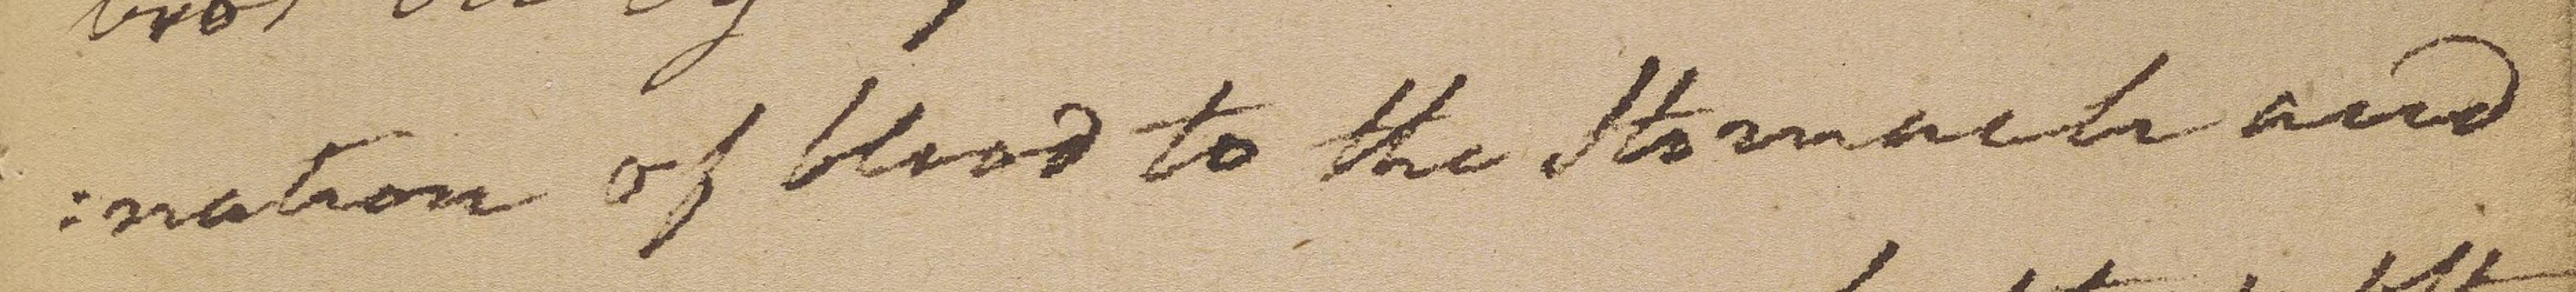-nation of blood to the stomach and
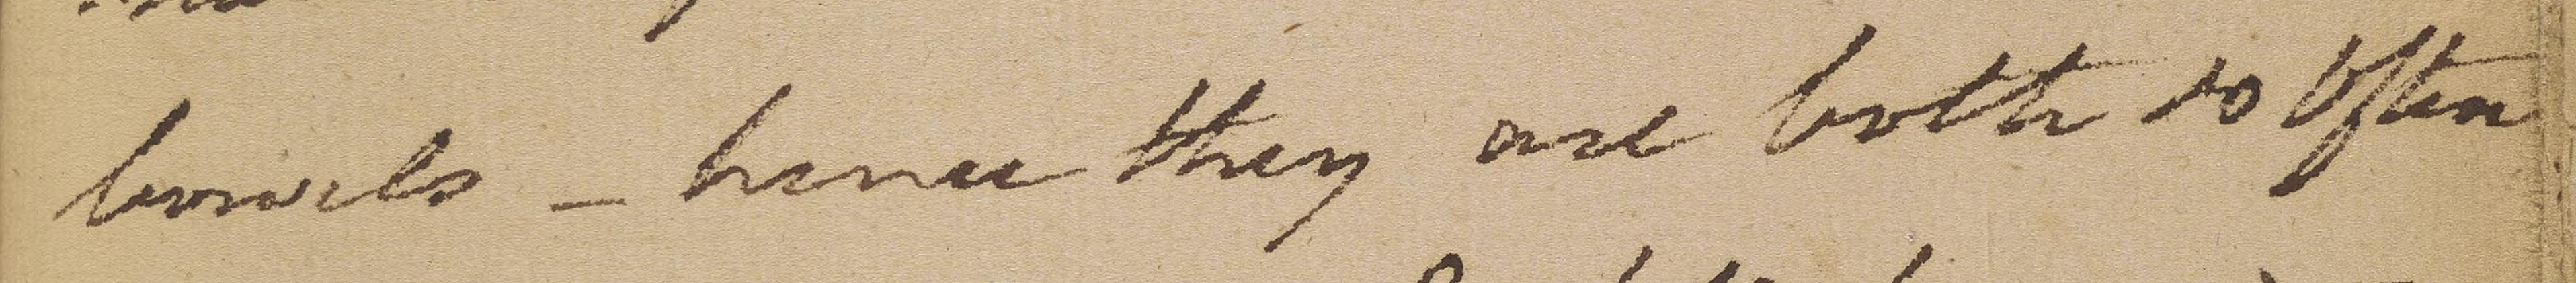bowels- hence they are both so often
